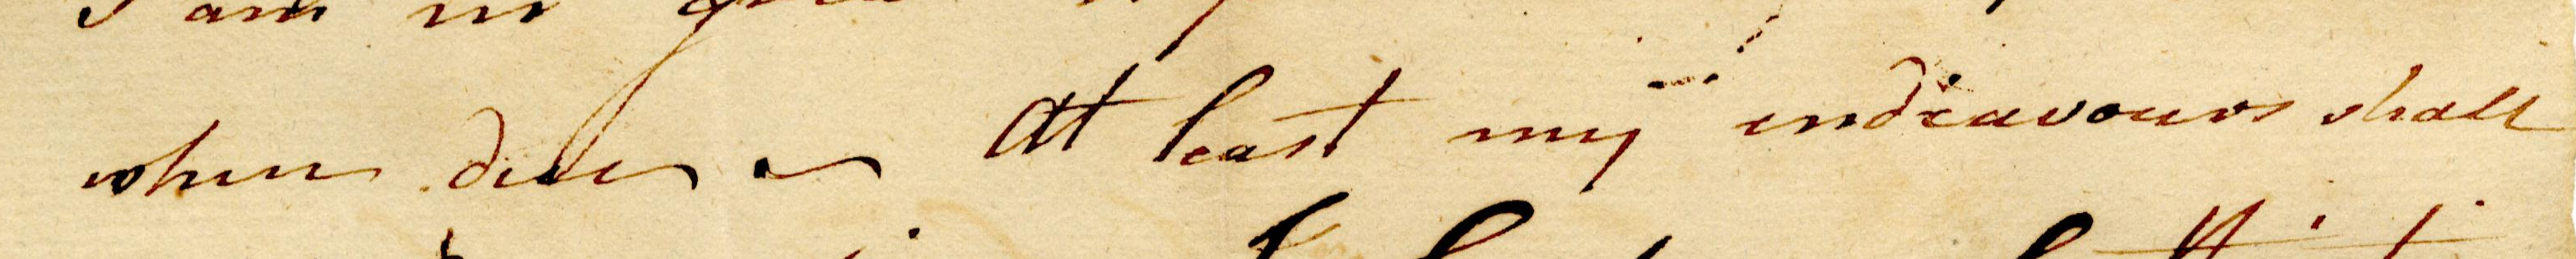when due.- At least my endeavours shall
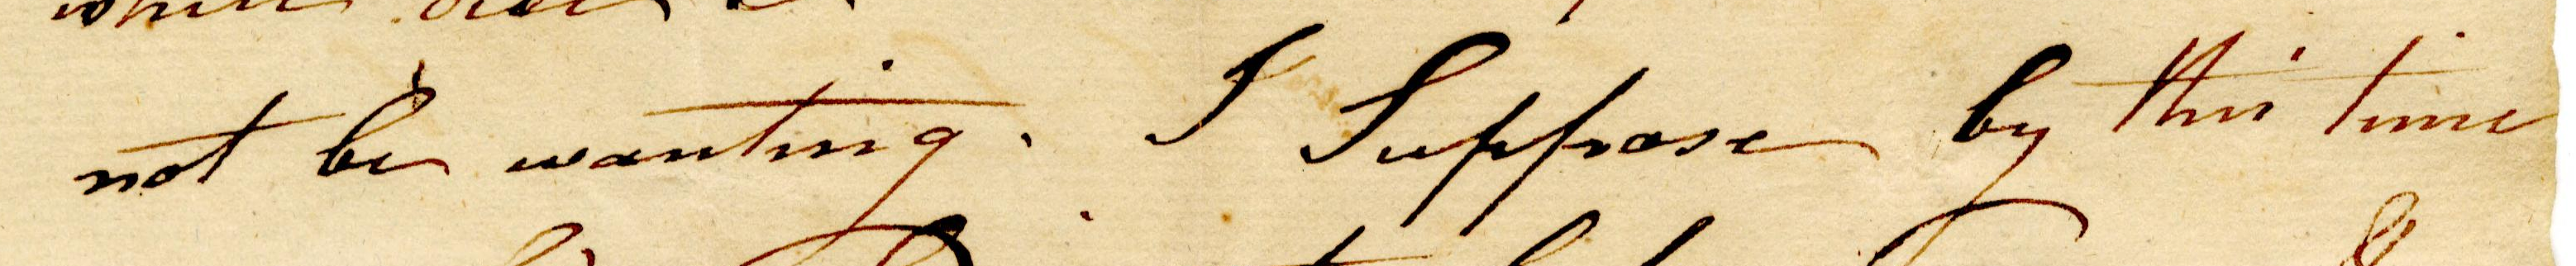not be wanting. I suppose by this time
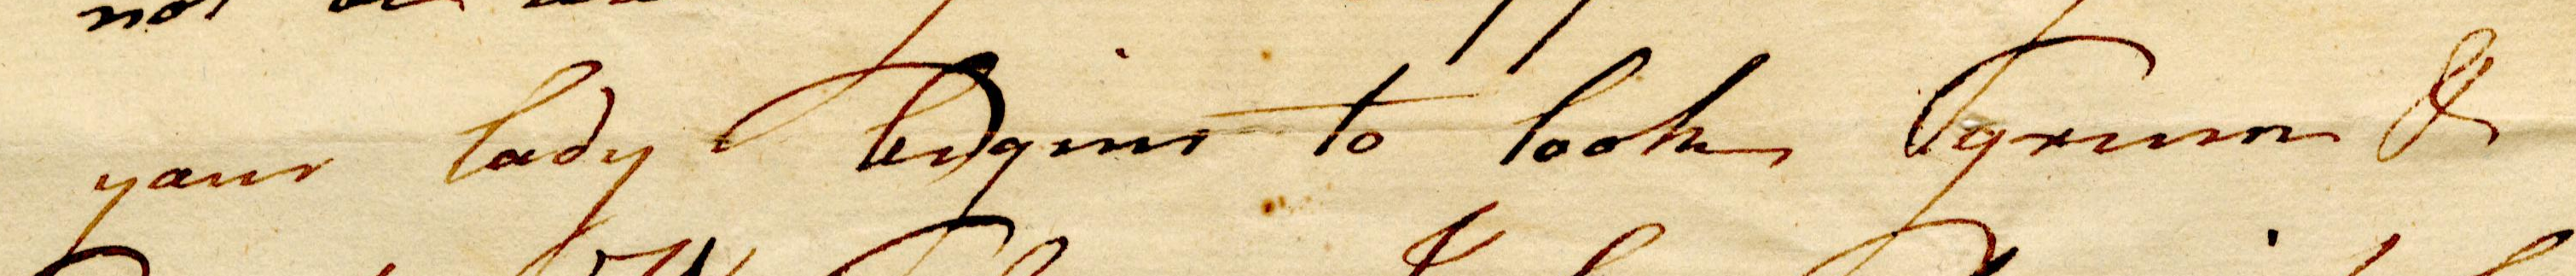your lady began to took grim &
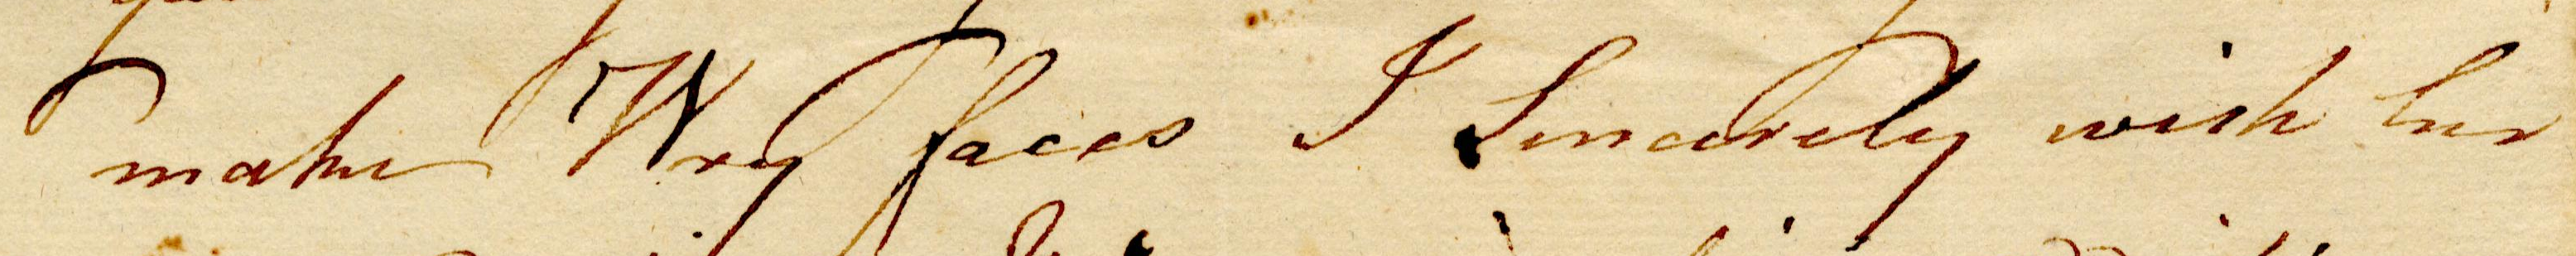make Wry faces I Sincerely wish her
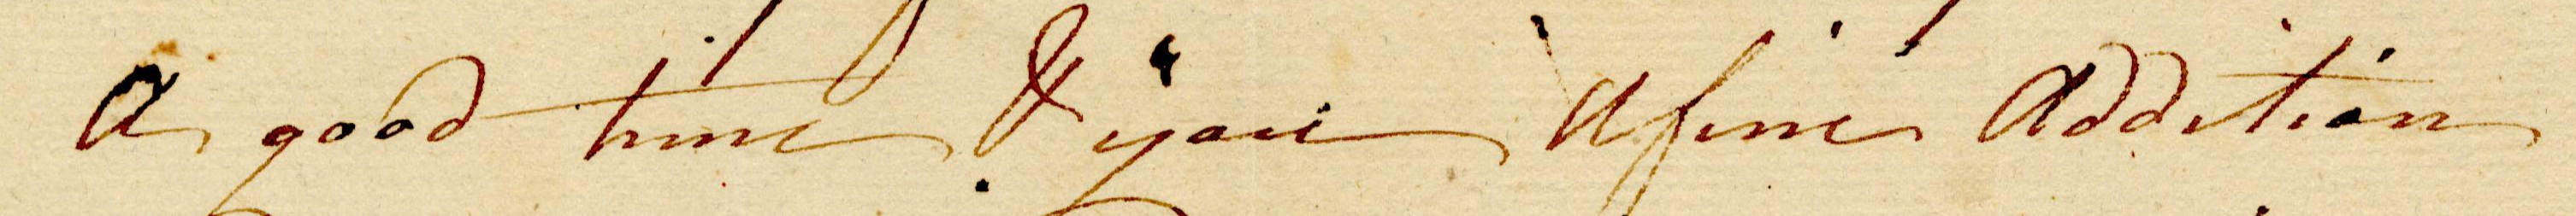a good time & you a fine Addition
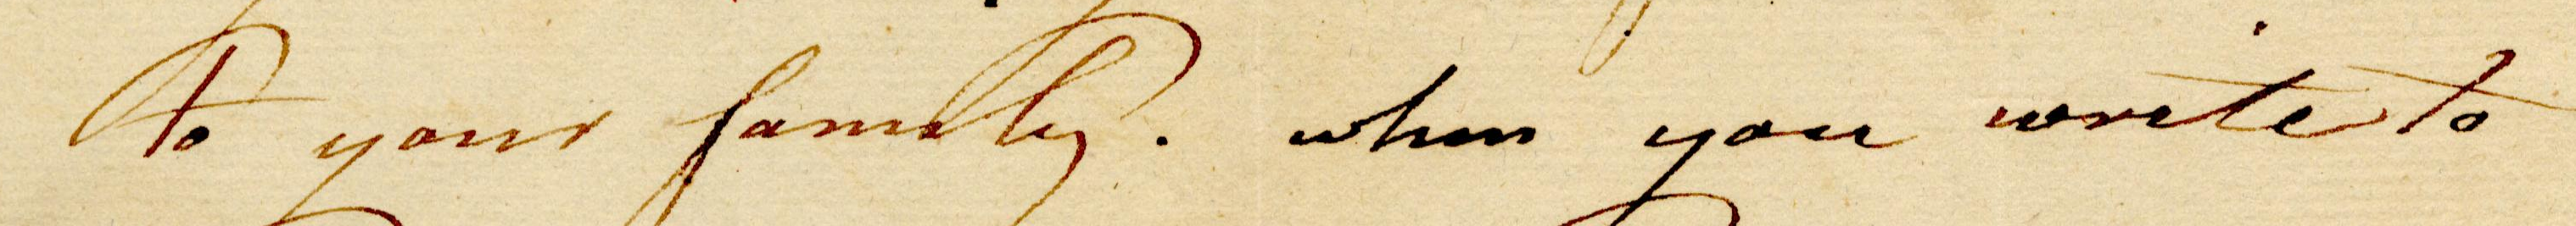to your family. when you write to
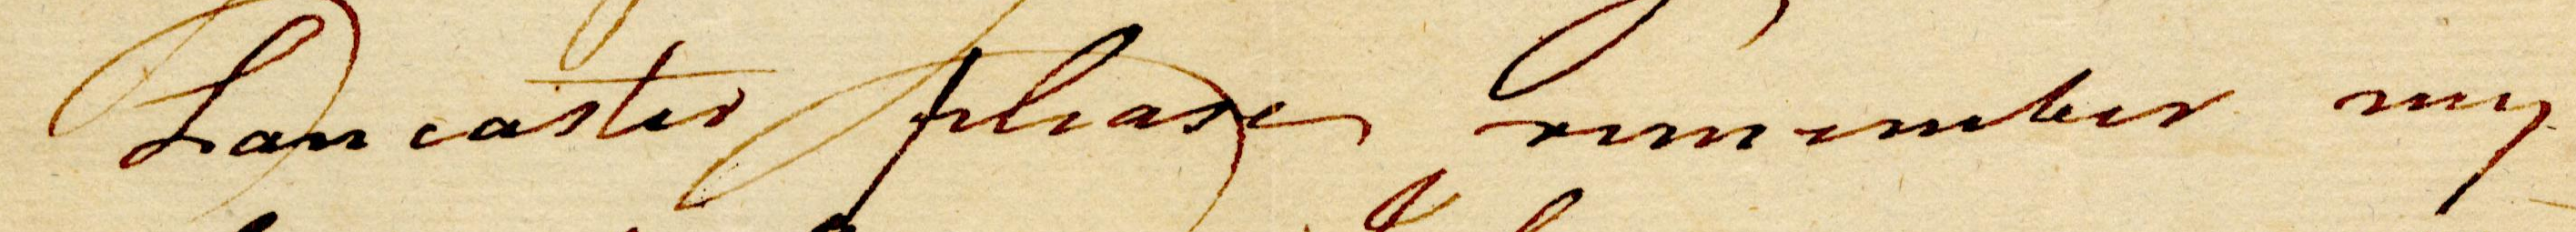Lancaster please remember my
